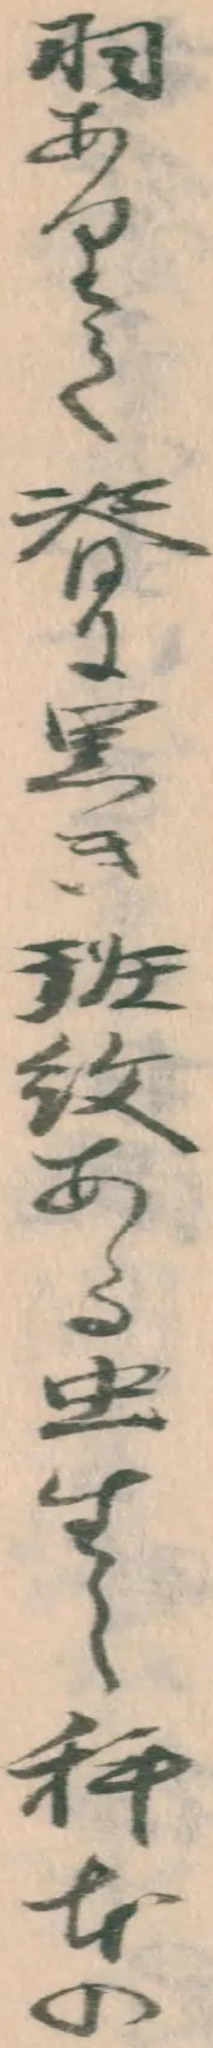羽ありて背に黒き斑紋ある虫生し科本の
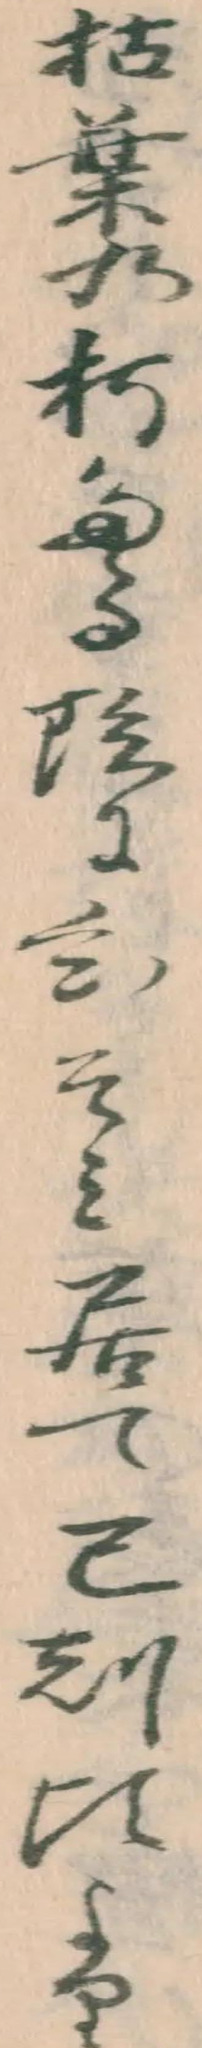枯葉の朽たる後にひそミ居て巳刻比より
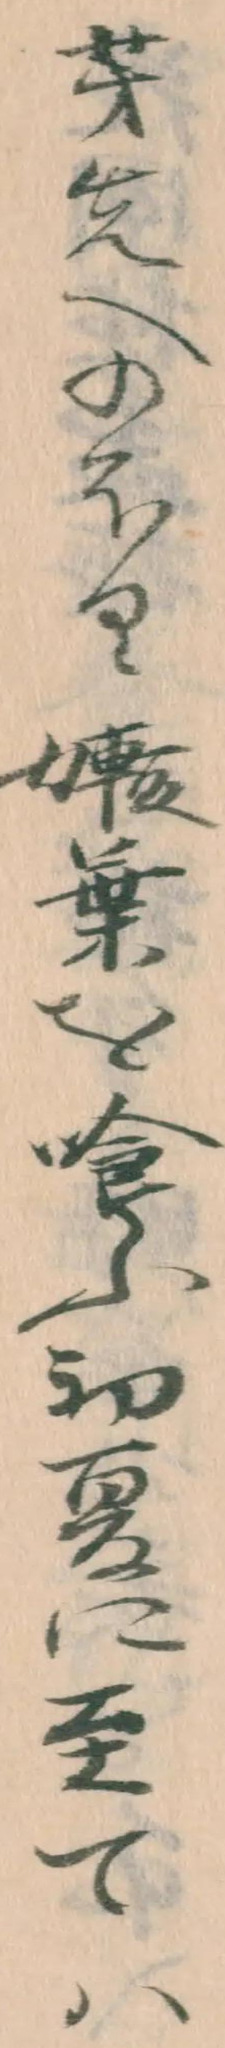芽先へのほり嫰葉を喰ふ初夏に至てハ
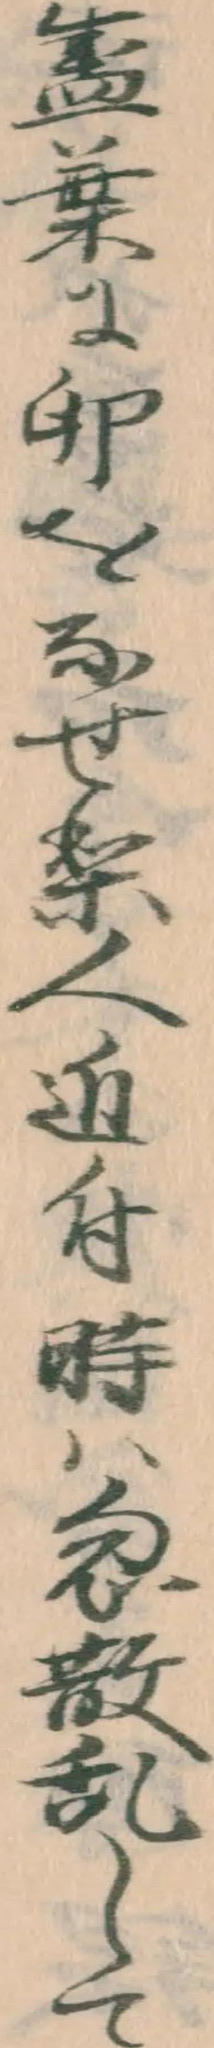盛葉に卵をなせり人近付時は急散乱して
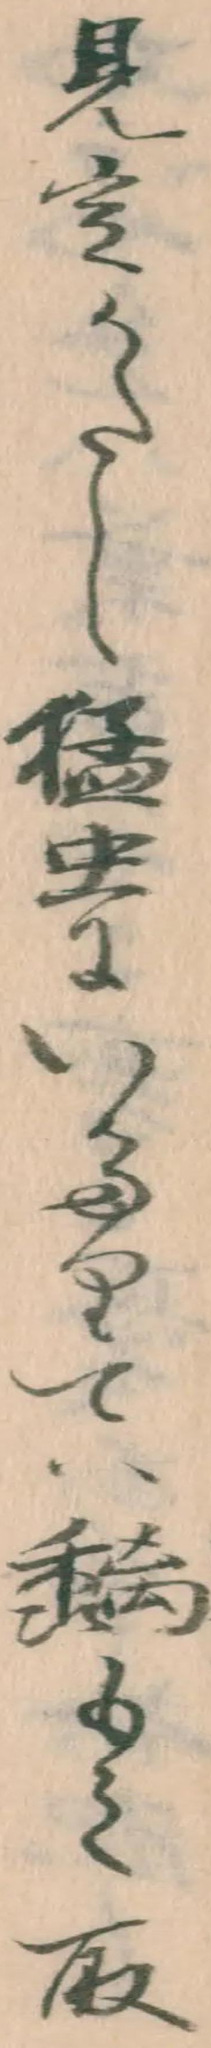見定かたし猛虫にいたりてハ黐もて取
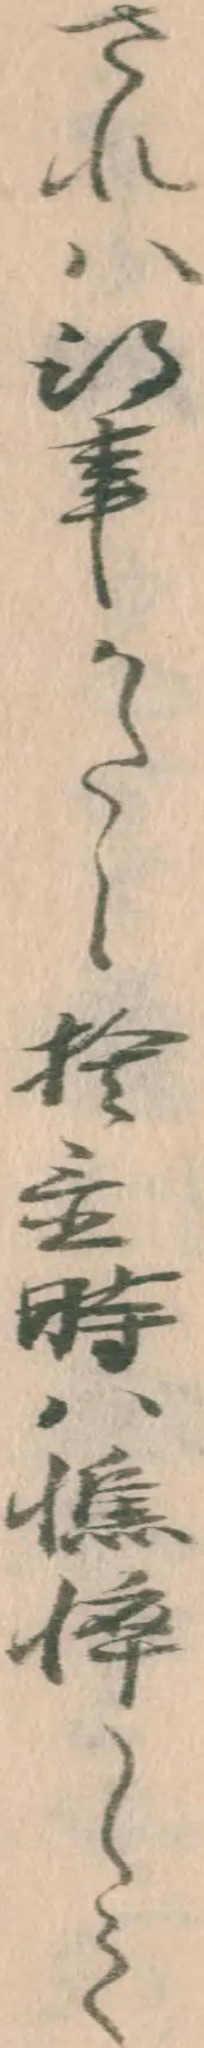されハ取事かたし捨置時は憔悴して
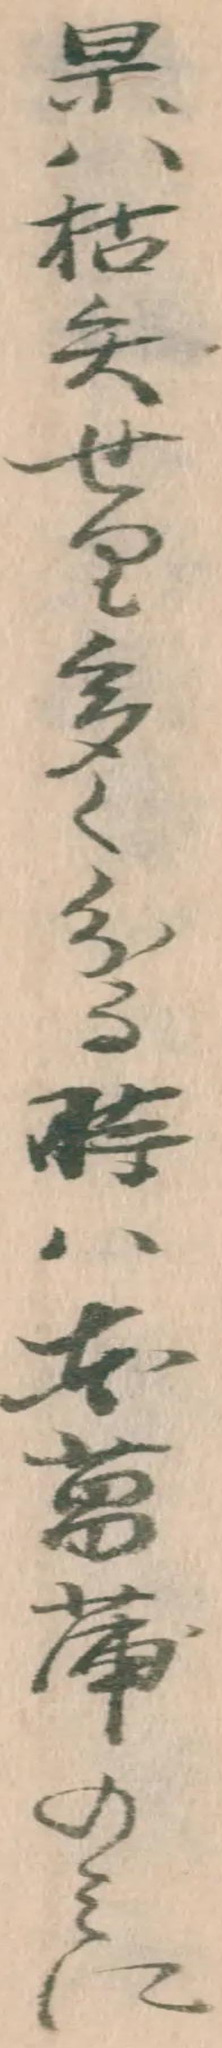果ハ枯失せるも多く分る時ハ花菖蒲のミに
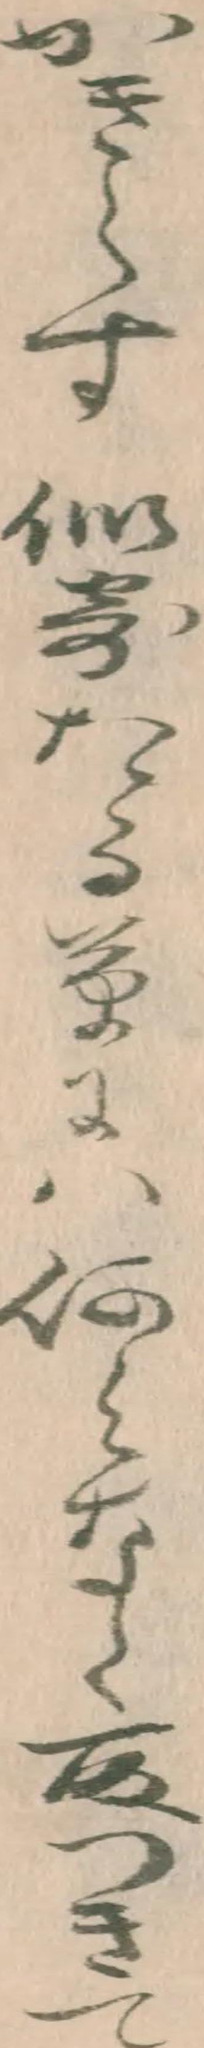かきらす似寄たる草にハ何となく取つきて
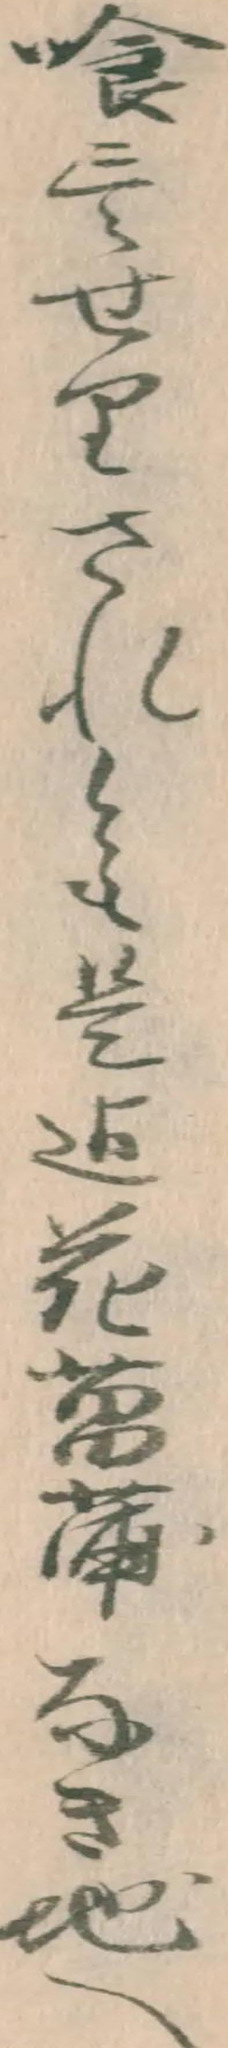喰尽せりされとも是迠花菖蒲なき地へ
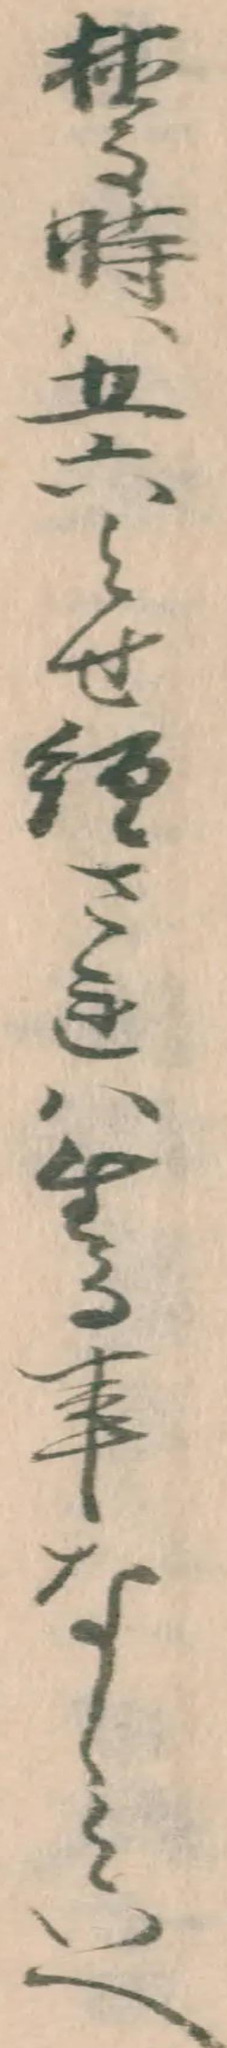植る時ハ五六とせ経されハ生る事なしといへ
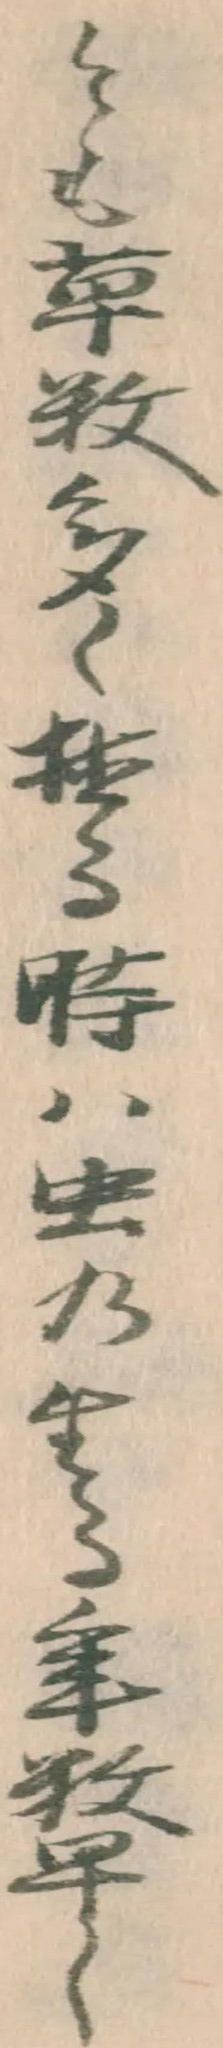とも草数多く植る時ハ虫の生る年数早く
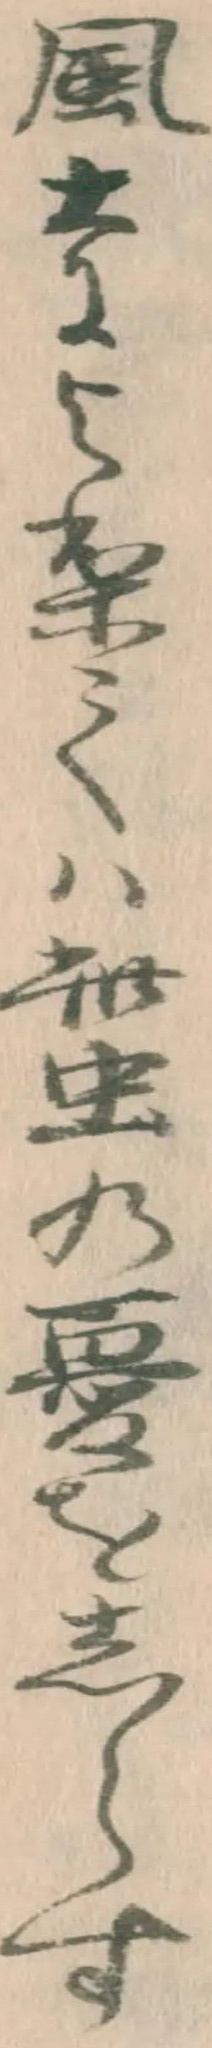風土によりてハ此虫の憂をしらす
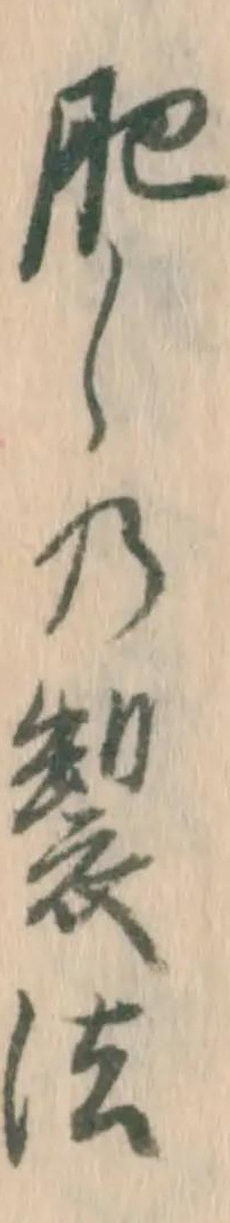肥しの製法

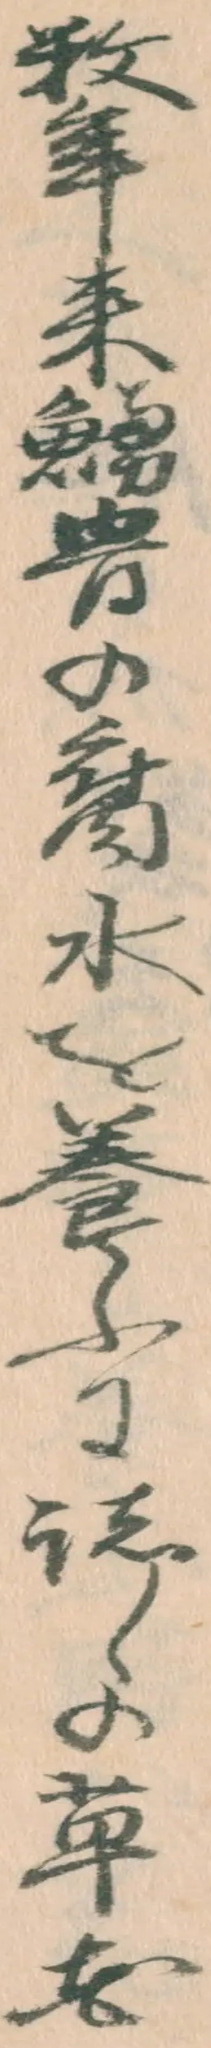数年来鰯骨の腐水を養ふに諸々の草花
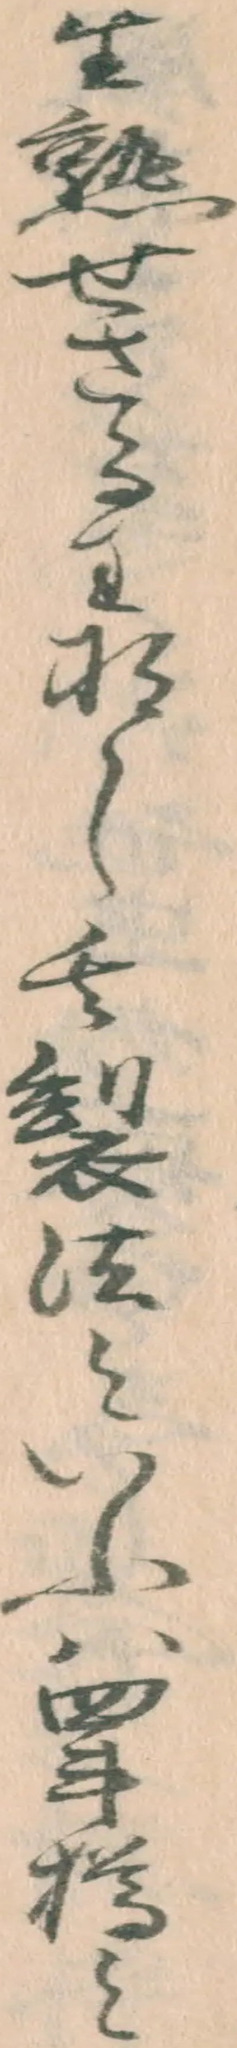生熟せさるとなし其製法といふハ四斗樽と
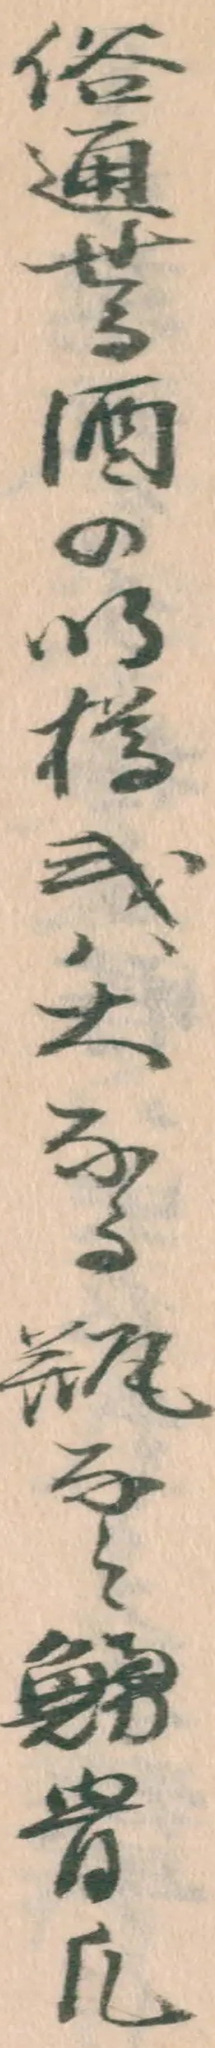俗通せる酒の明樽或ハ大なる瓶なと鰯骨凡
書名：花菖培養録
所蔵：国立国会図書館 National Diet Library, JAPAN
